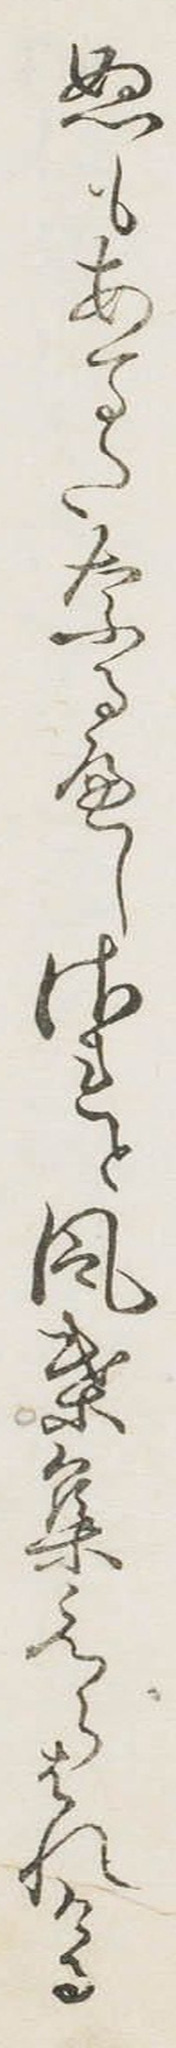ぬもあまたなるへしされと風葉集えらはれける
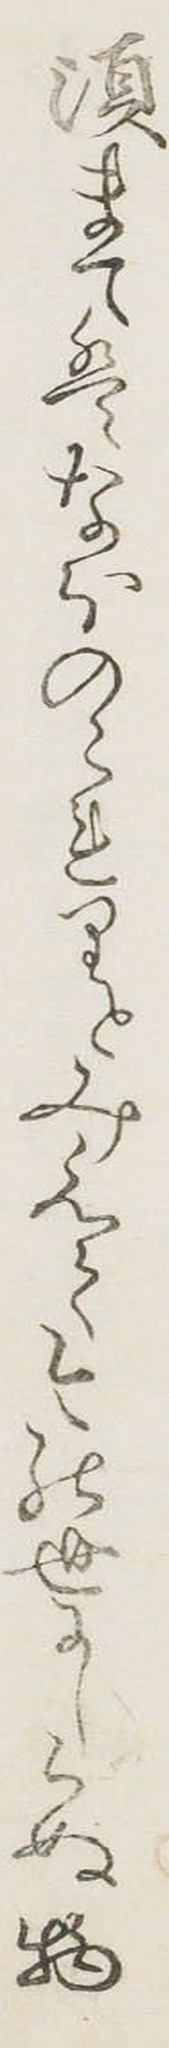頃まてはなほのこれりとみえて今の世にしらぬ物
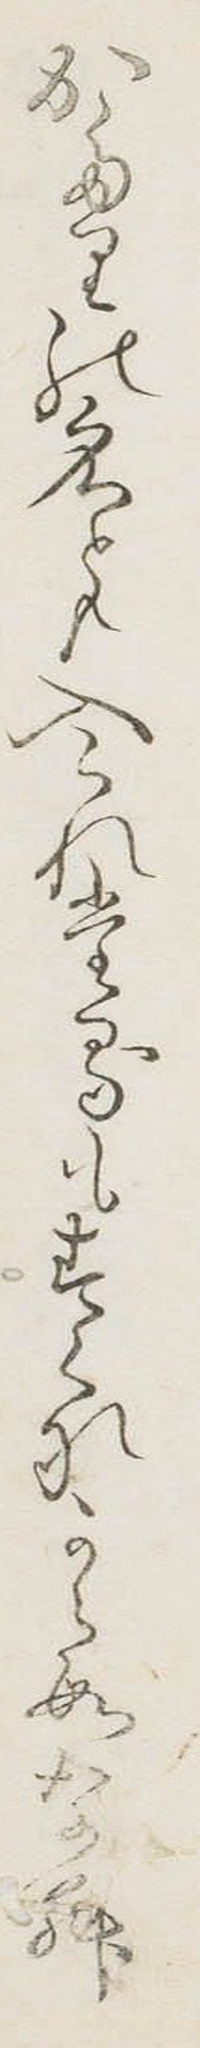かたりの名とも入られたるもすくなからすなむ
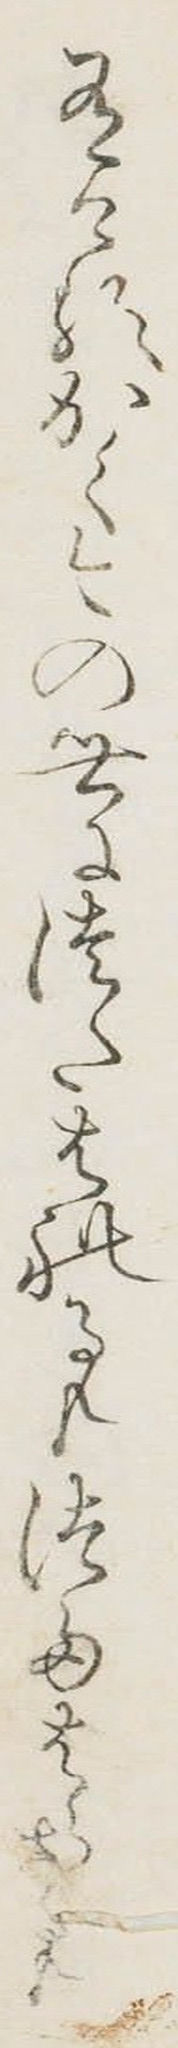有けるかく今の世につたはれるもつたはらさるも
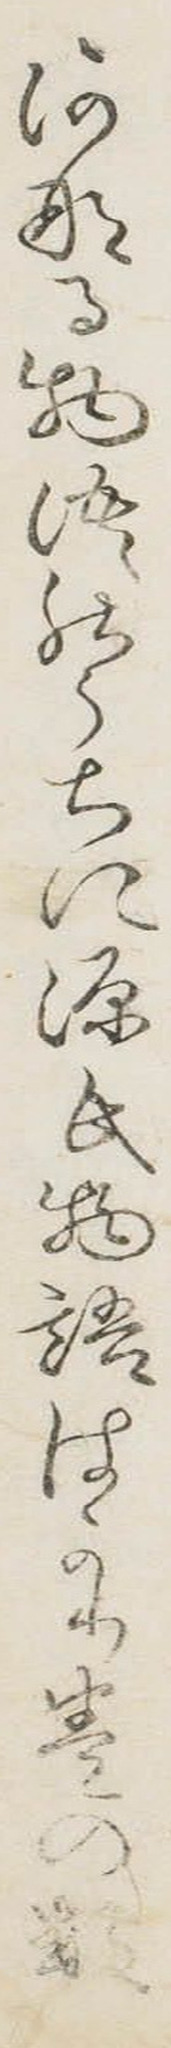あなる物語のうちに源氏物語はかり巻の数

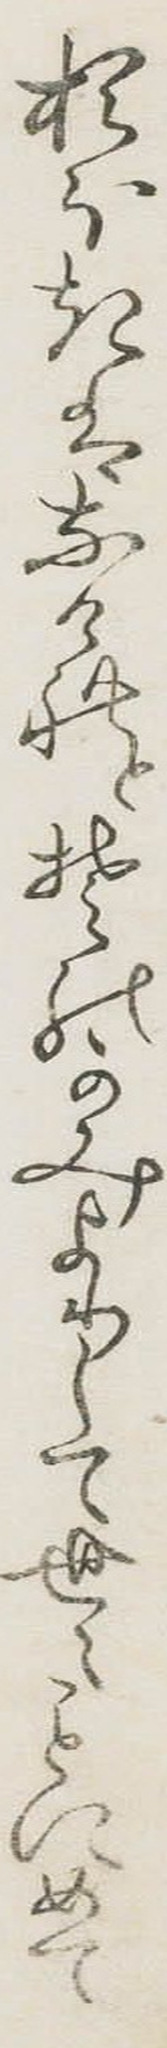おほきはなけれとそのかみよりして世々ことにめて
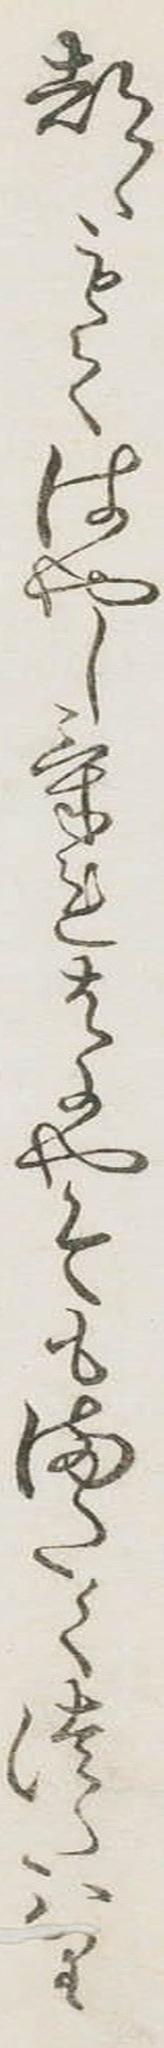つゝもてはやしけれはにや今もまたくつたはり
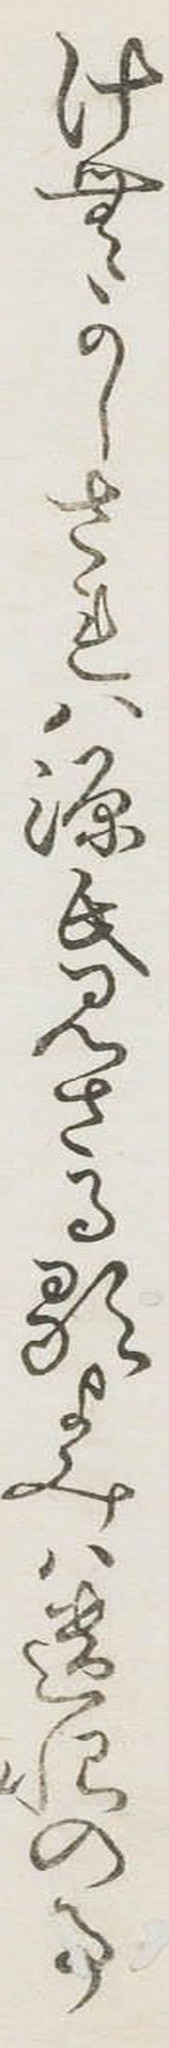けむかしされは源氏見さる歌よみは遺恨の事
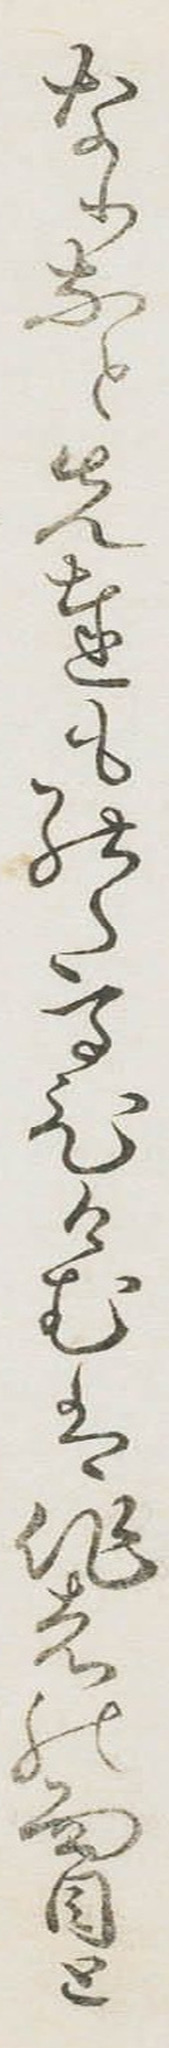なりなと先達ものたまひけむは作者の面目と
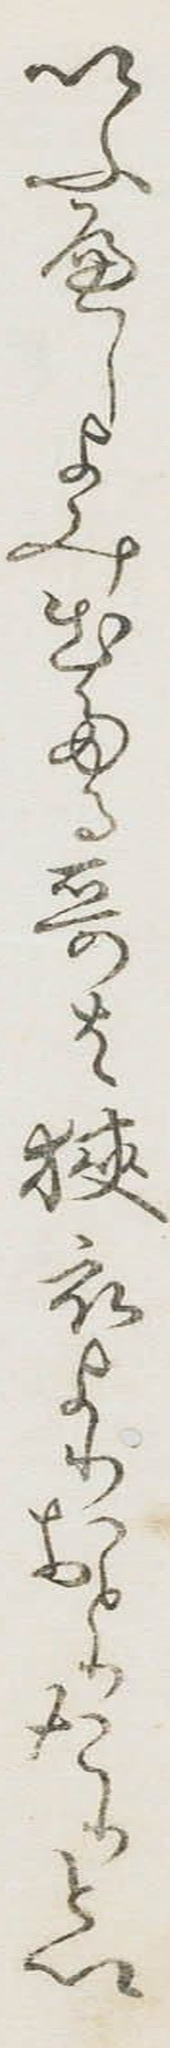いふへしよみ出たる哥は狭衣よりおとりたりとい
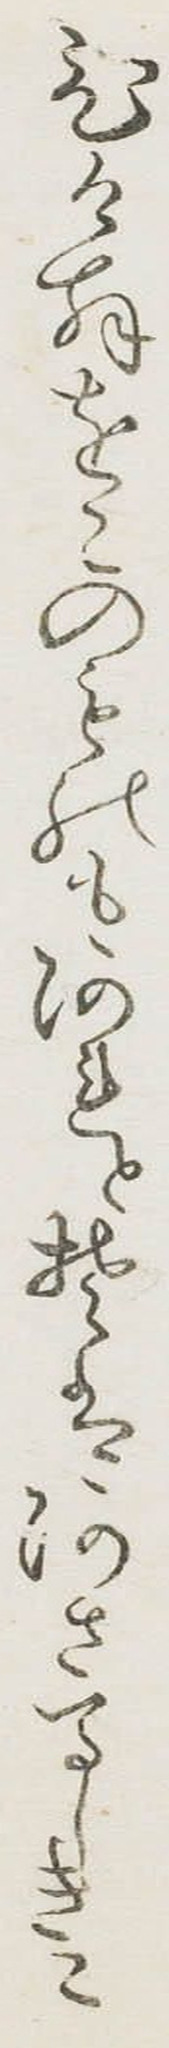ひけむをこのものもあれとそはあさましきこ
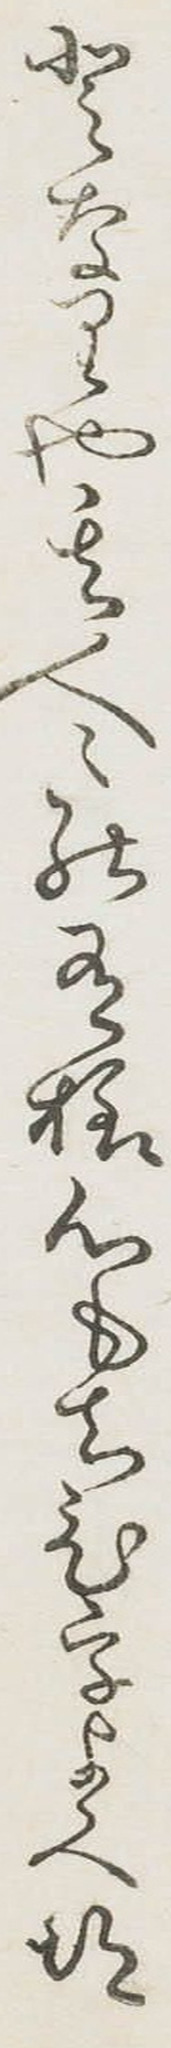となりや其人々の有様心もちひをよく得
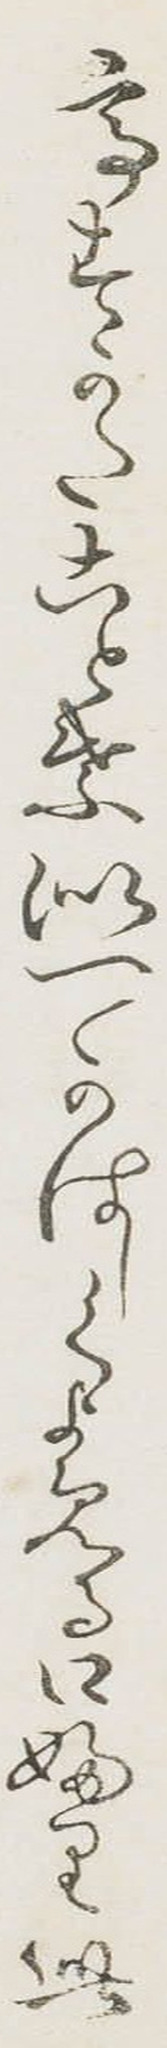てすかたこと葉似つかはしくよめる口ふり此
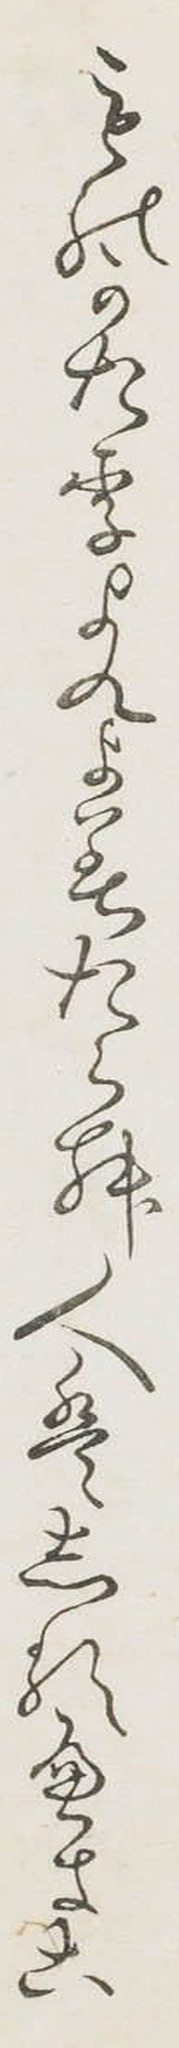ものかたりよくよみたらむ人はしるへきこ
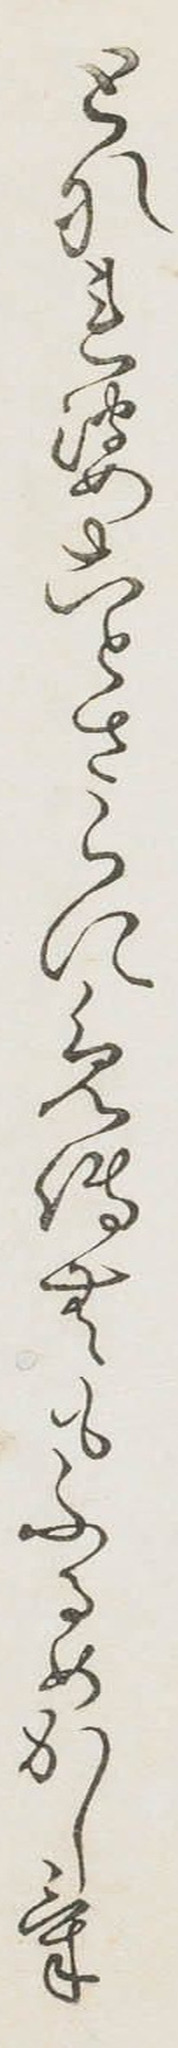となればことさらにめてむもふるめかしけ
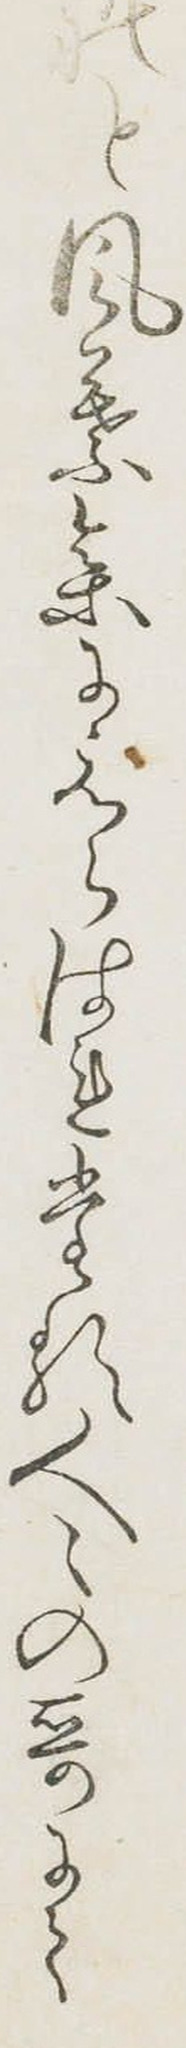れと風葉集にえらはれたる人々の哥にて
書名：源氏百人一首
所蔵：東京学芸大学教育コンテンツアーカイブ
